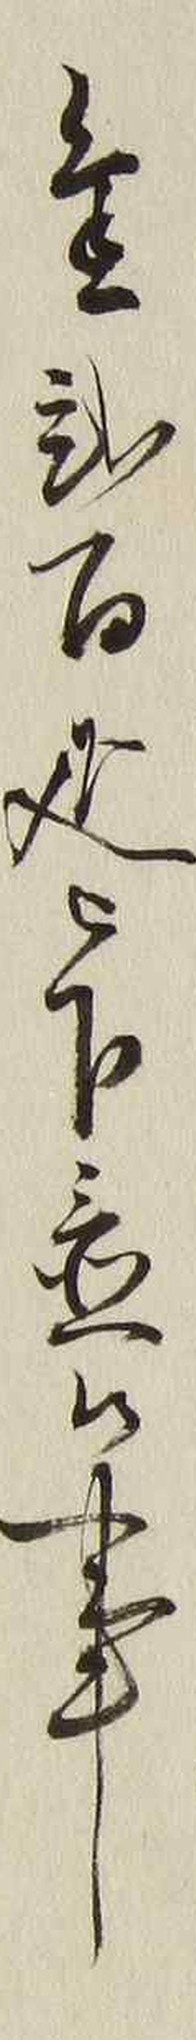金弐百疋被下置候事
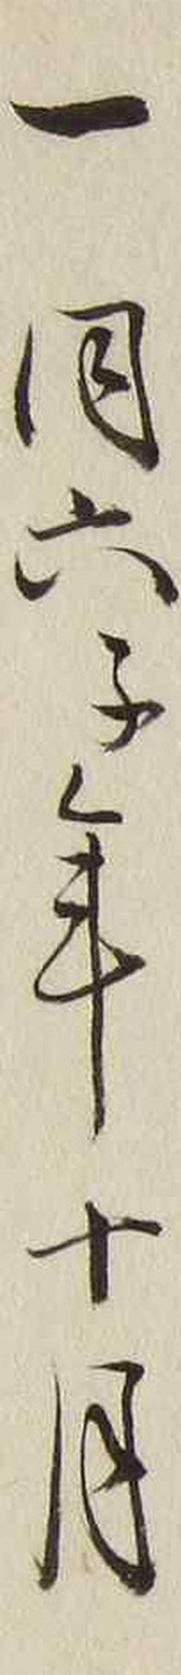一同六子年十月

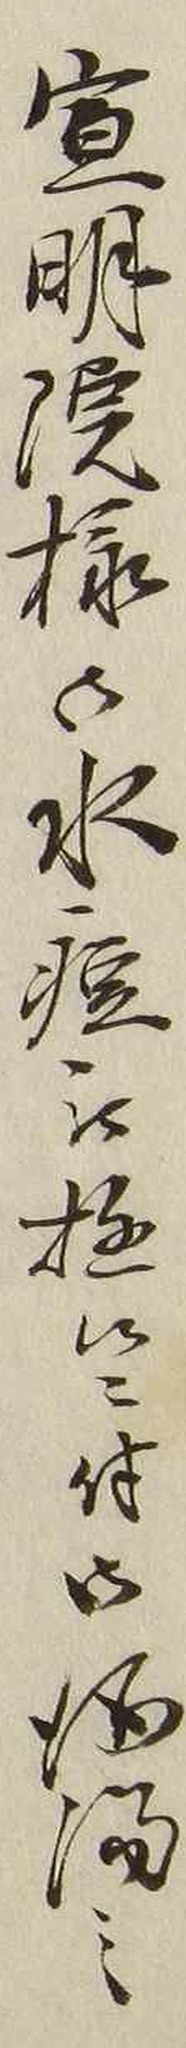宣明院様御水痘被遊候に付御酒湯之
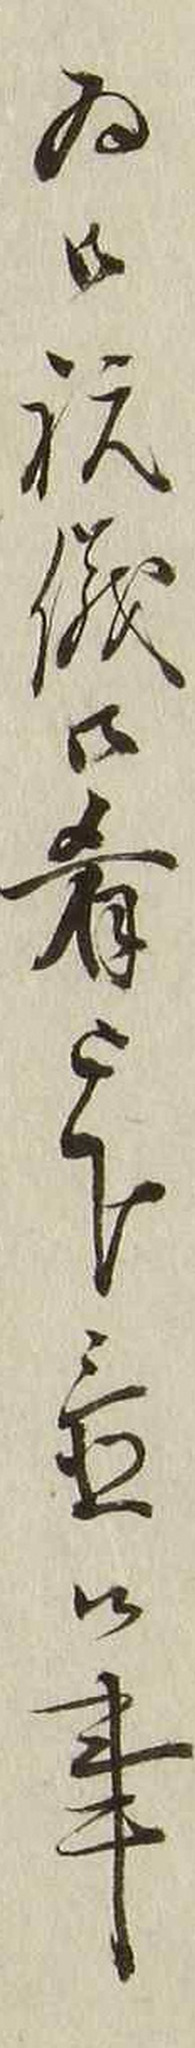為御祝儀御肴被下置候事
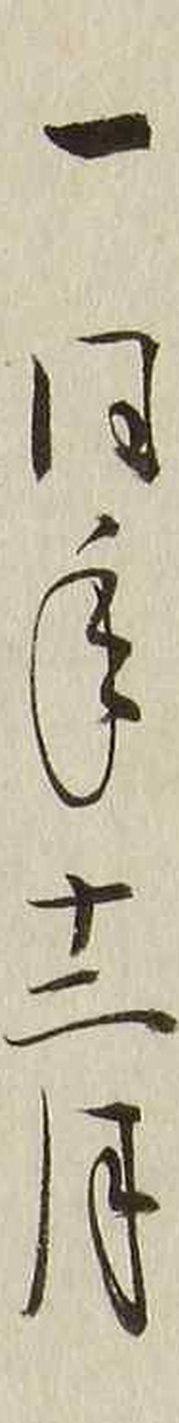一同年十二月
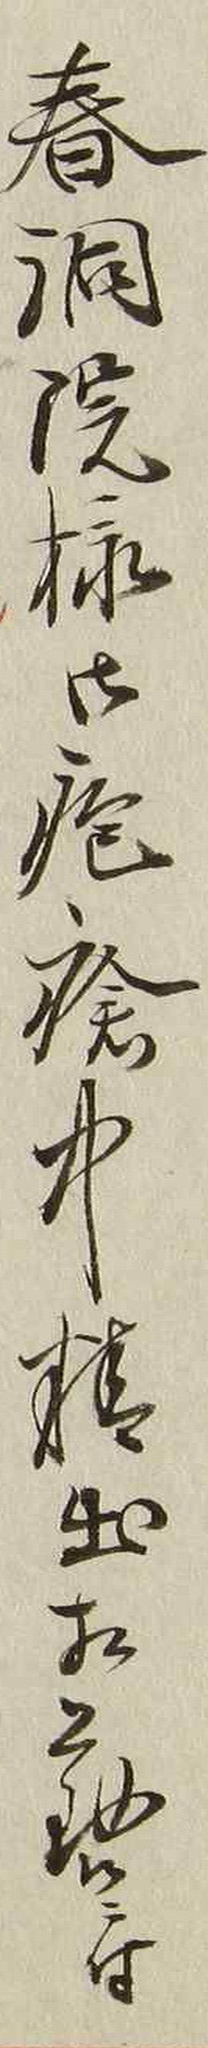春洞院様御疱瘡中精出相勤候に付
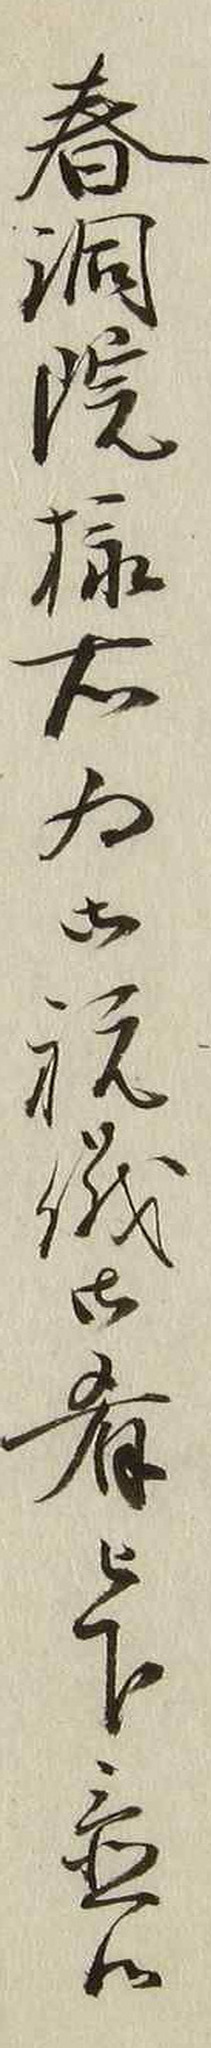春洞院様右為御祝儀御肴被下置候
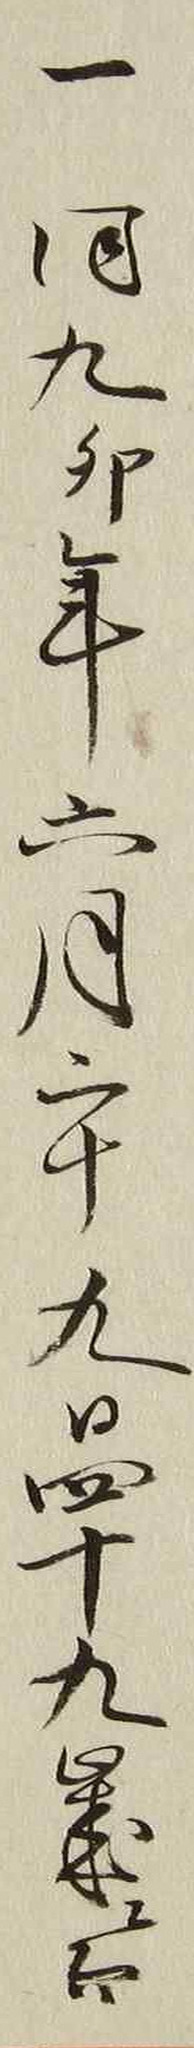一同九卯年六月二十九日四十九歳に而
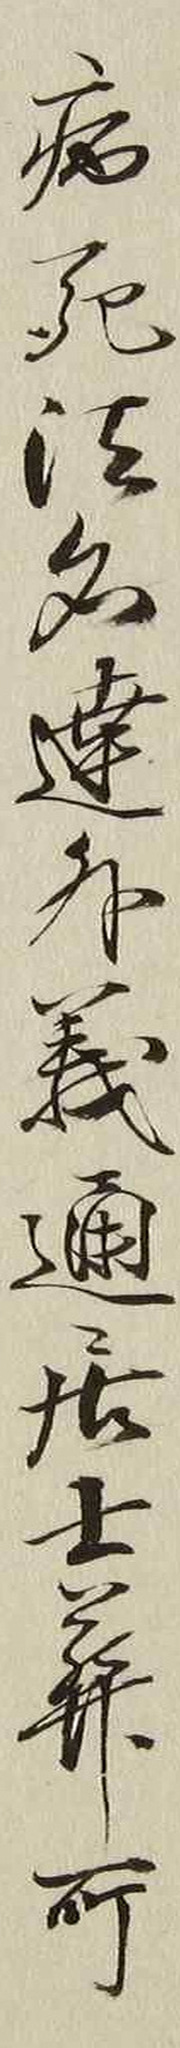病死法名達外義通居士葬所
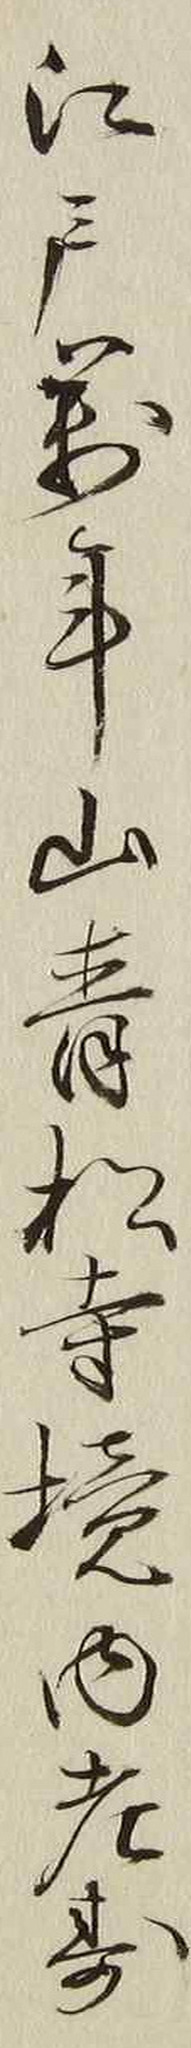江戸万年山青松寺境内老寿
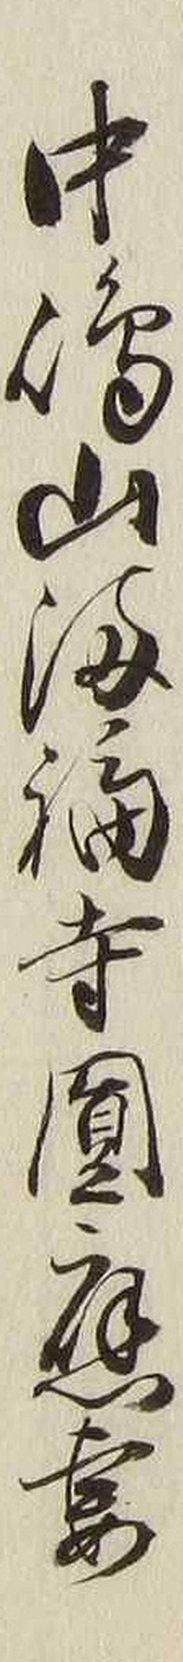女中嶋山満福寺円応妻

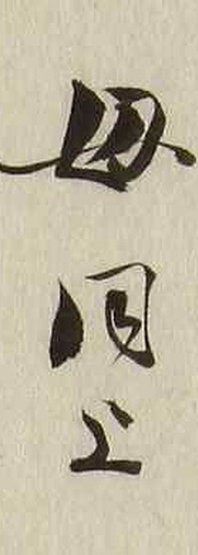母同上
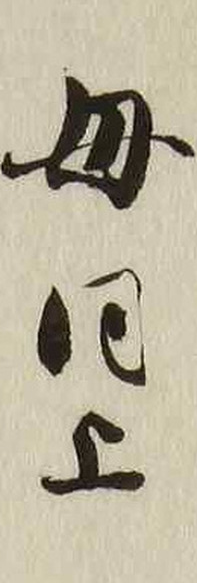母同上
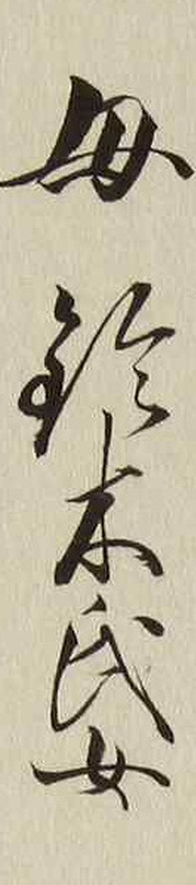母鈴木氏女
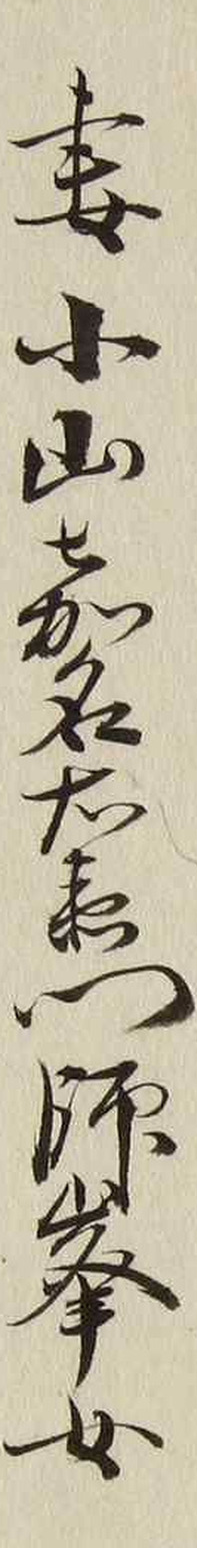妻小山嘉名右衛門師峯女
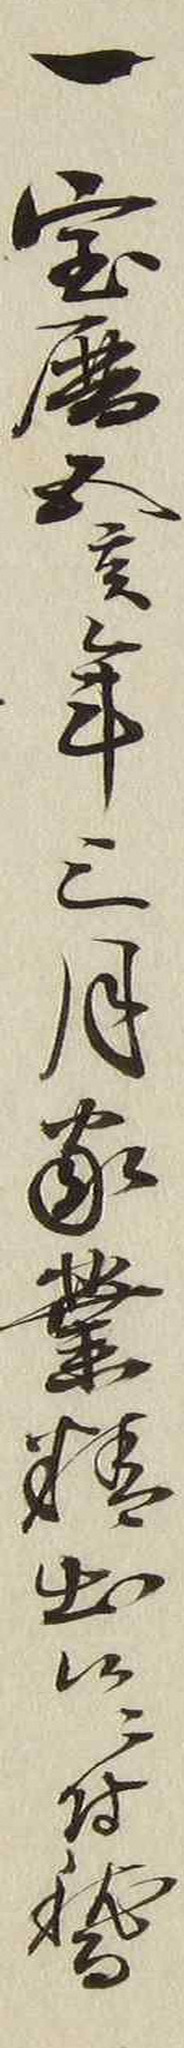一宝暦五亥年三月家業精出候に付稽
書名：諸士系譜　巻之157　ね之部1
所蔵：会津若松市立会津図書館
